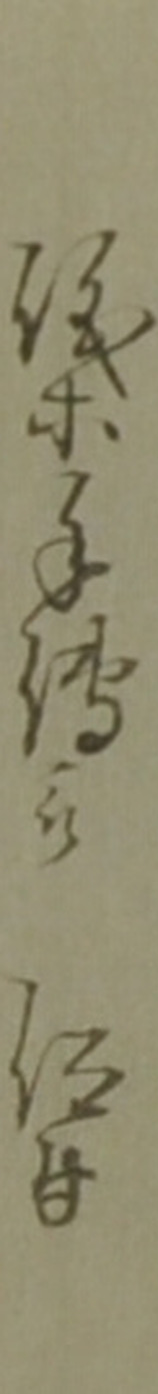儀等手伝被仰付
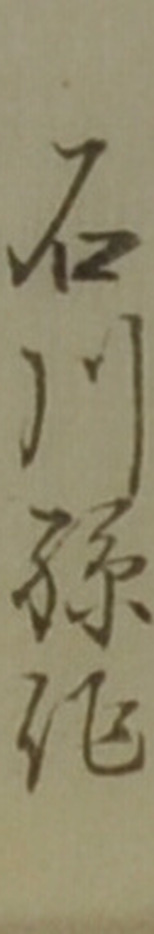石川孫作
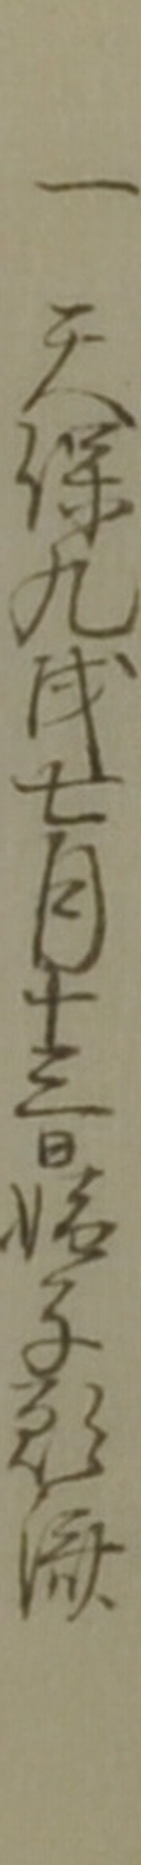一天保九戌七月十三日嫡子願済
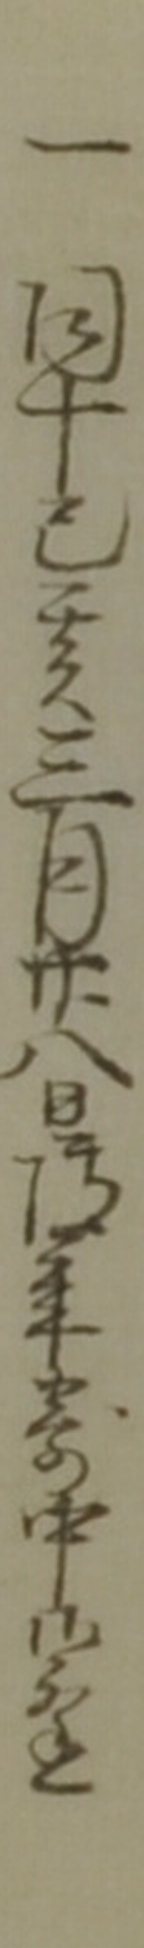一同十己亥三月廿八日御年寄中御逢
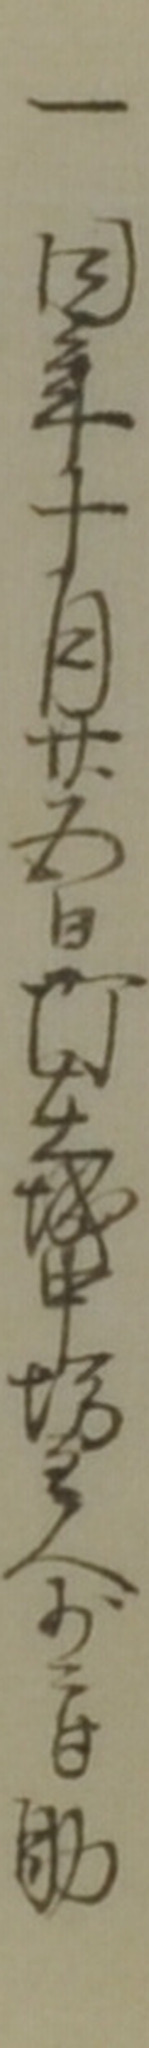一同年十月廿五日御在城中坊主人少ニ付助
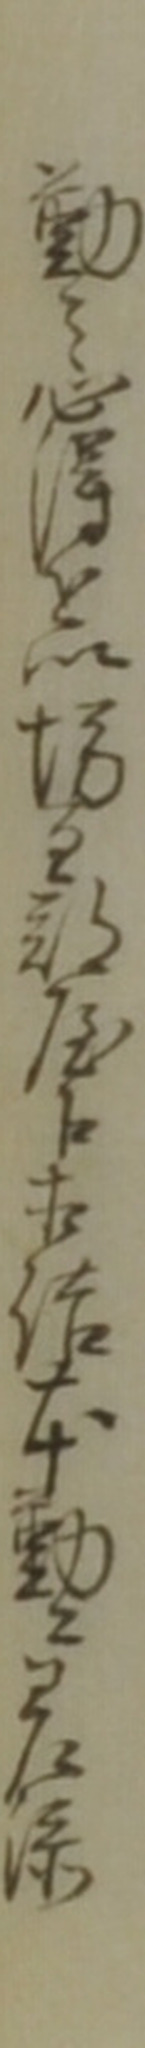勤之心得を以坊主部屋江相詰本勤ニ差添
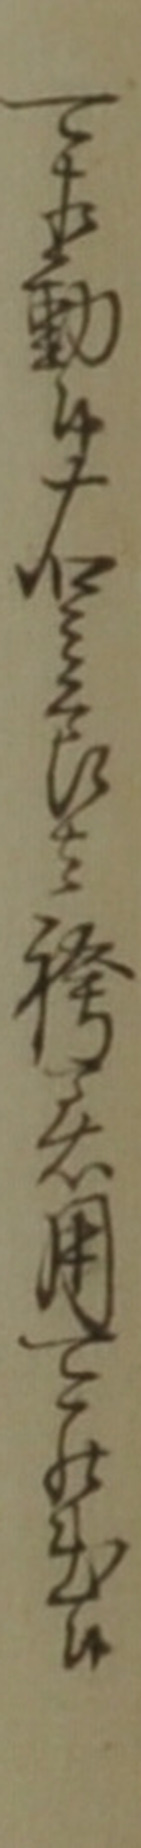可相勤候右之節者袴着用可罷出候
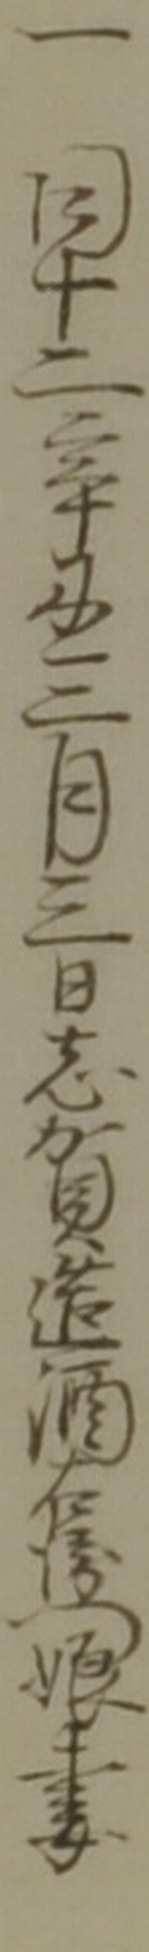一同十二辛丑三月三日志賀造酒右衛門娘妻
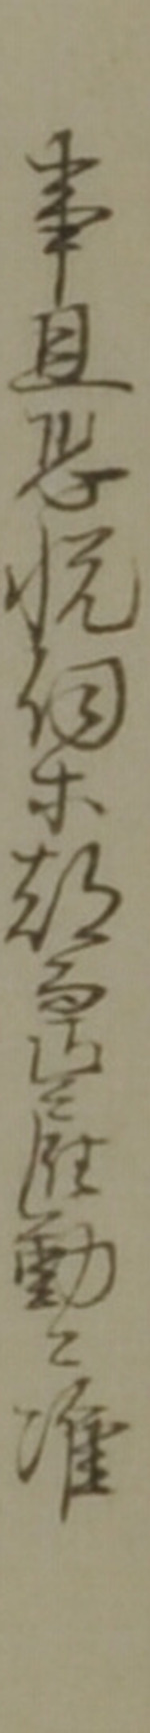事且恐悦伺等都而御雇勤ニ准
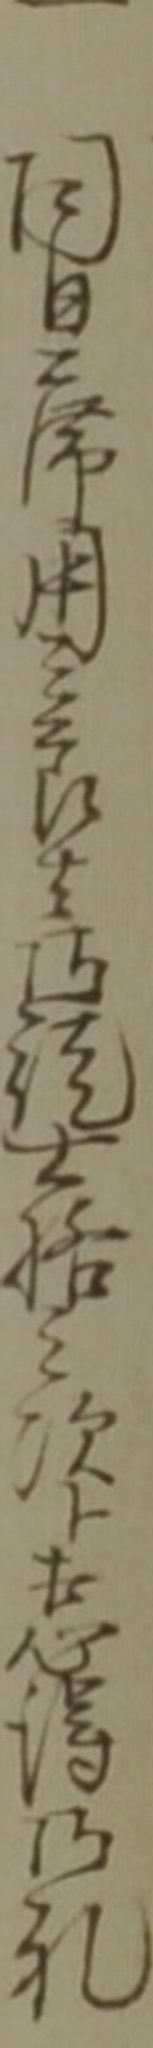一同日席用之節者御徒士格之次ト相心得御礼
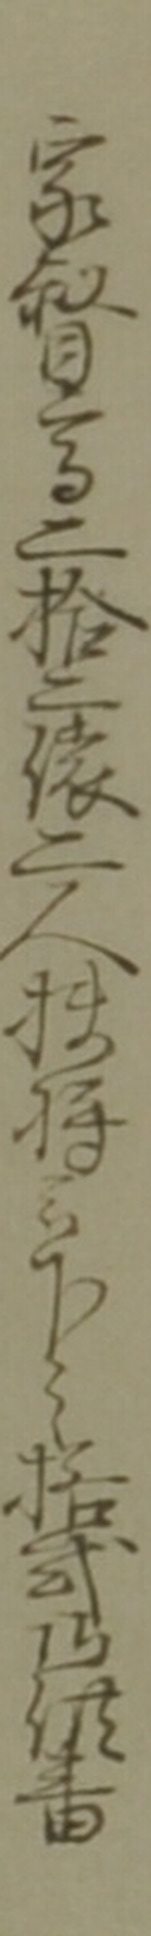家督高二拾二俵二人扶持被下之格式御供番
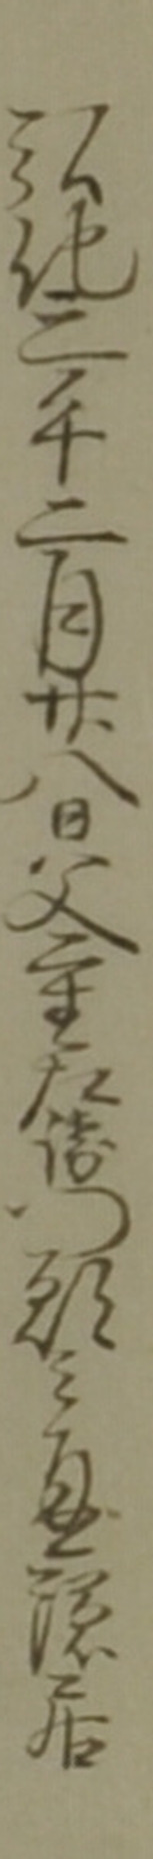一弘化三午二月廿八日父重左衛門願之通隠居

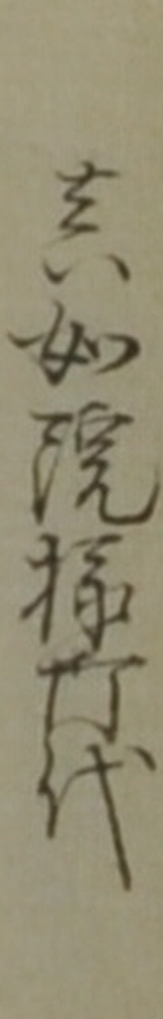真如院様御代
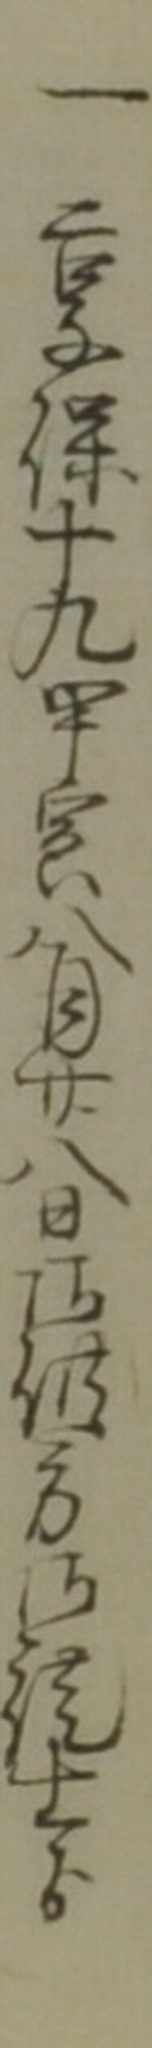一享保十九甲寅八月廿八日御供方御徒士ゟ
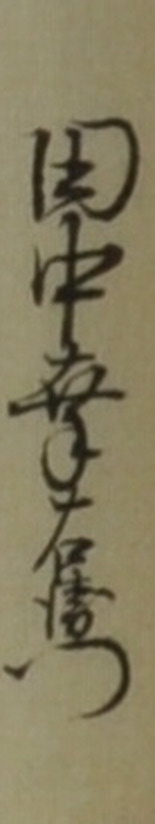田中幸右衛門
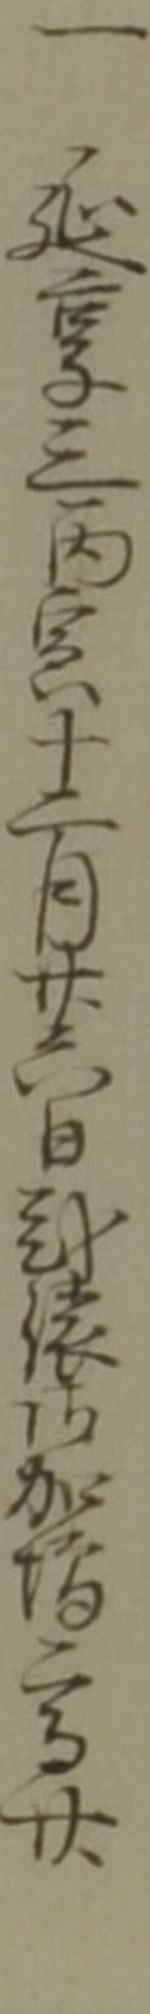一延享三丙寅十二月廿六日弍俵御加増高廿
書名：無足諸士勤仕録（五）
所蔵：伊那市立高遠町図書館・合同会社AMANE
